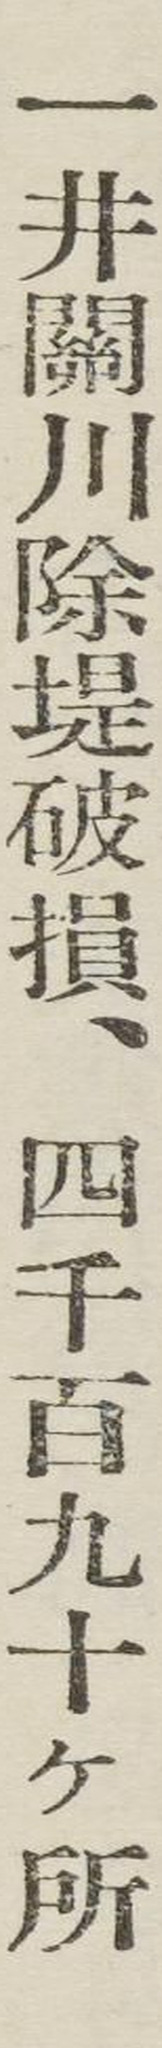一井関川除堤破損、四千百九十ヶ所
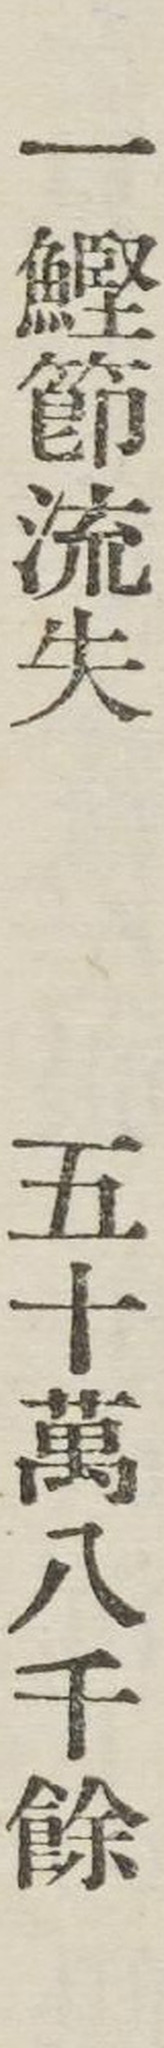一鰹節流失五十万八千余
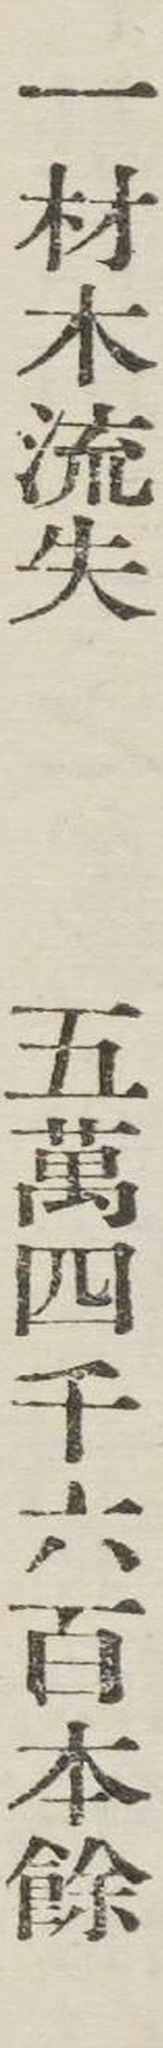一材木流失五万四千六百本余
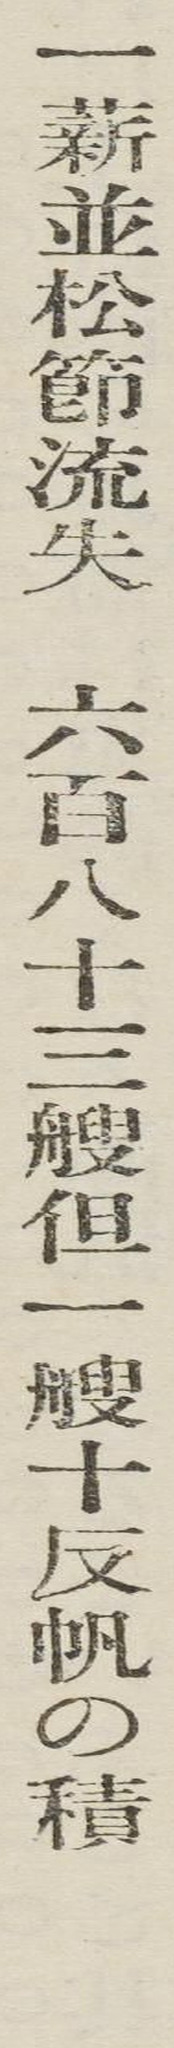一薪並松節流失六百八十三艘但一艘十反帆の積
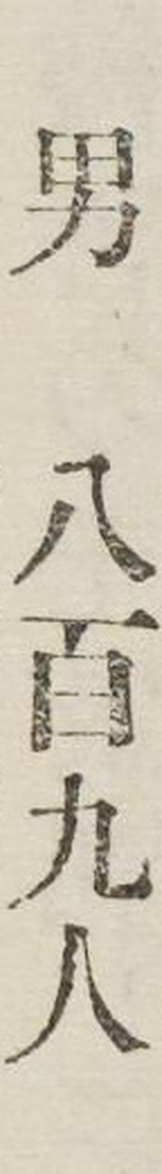男八百九人
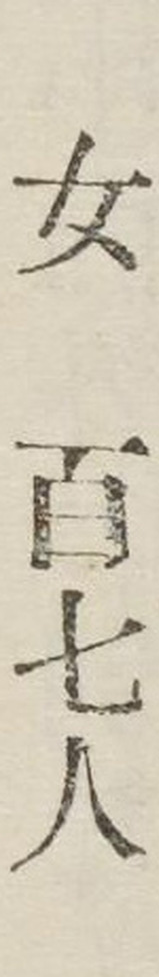女百七人
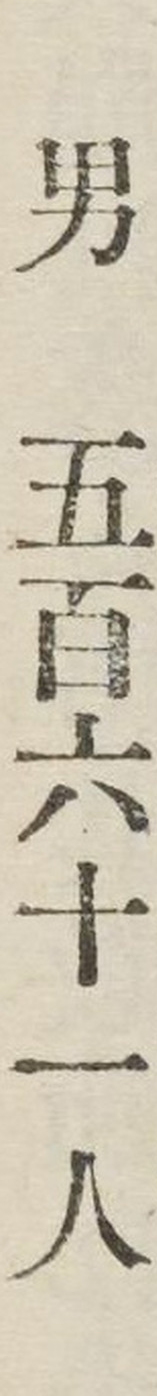男五百六十一人
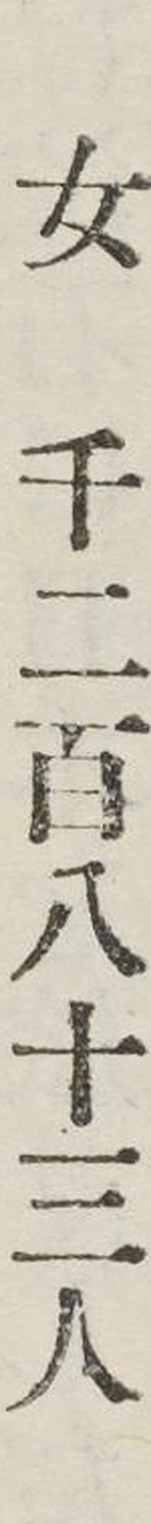女千二百八十三人
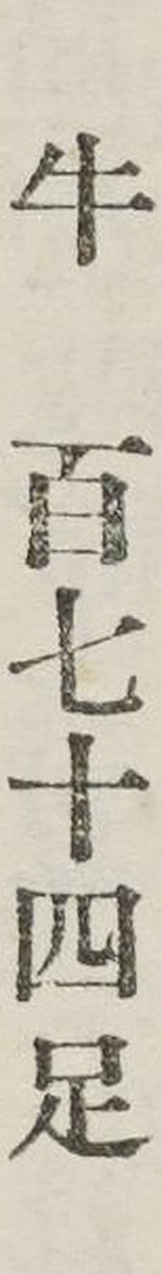牛百七十四足
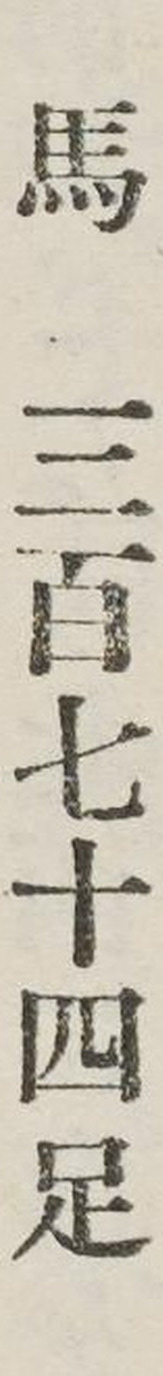馬三百七十四足
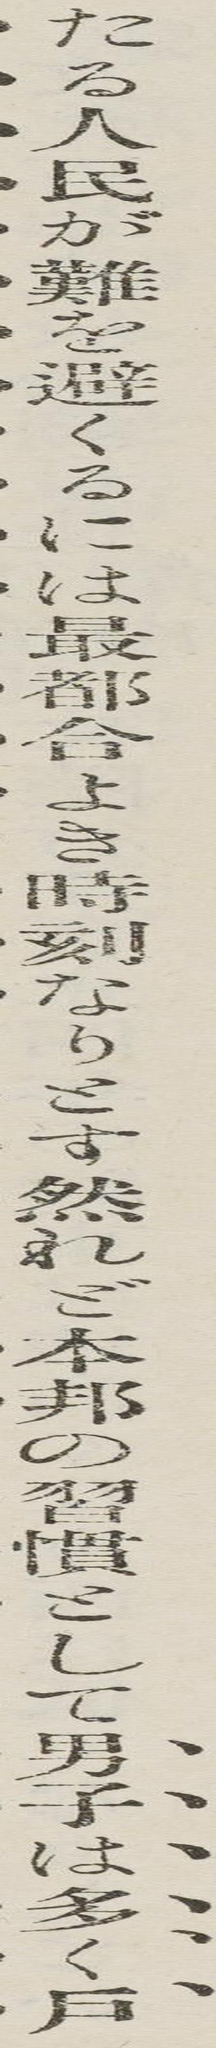たる人民が難を避くるには最都合よき時刻なりとす然れど本邦の習慣として男子は多く戸
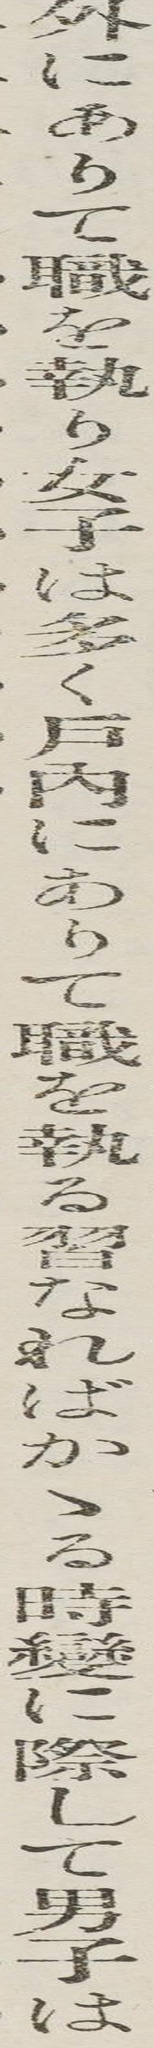外にありて職を執り女子は多く戸内にありて職を執る習なればかゝる時変に際して男子は
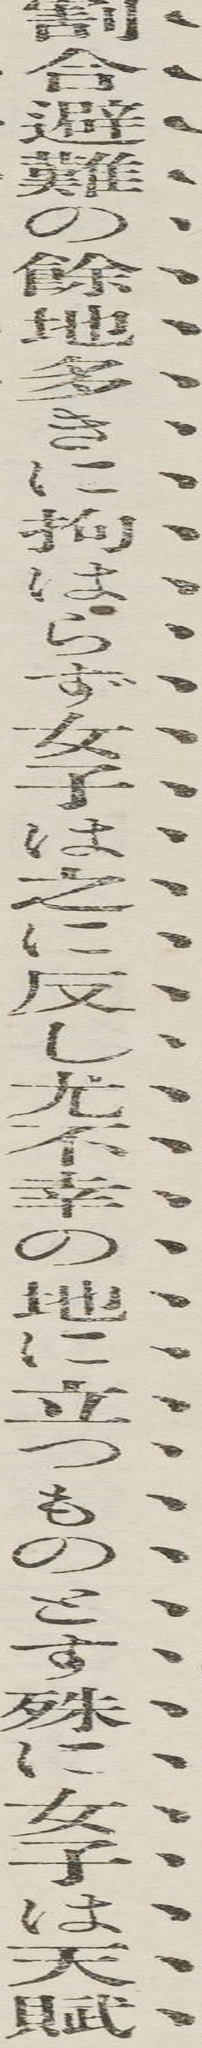割合避難の余地多きに拘はらず女子は之に反し尤不幸の地に立つものとす殊に女子は天賦
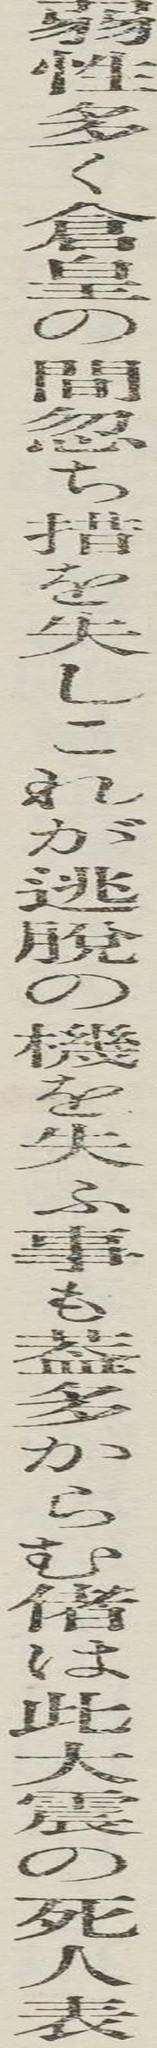弱性多く倉皇の間忽ち措を失しこれが逃脱の機を失ふ事も葢多からむ偖は此大震の死人表
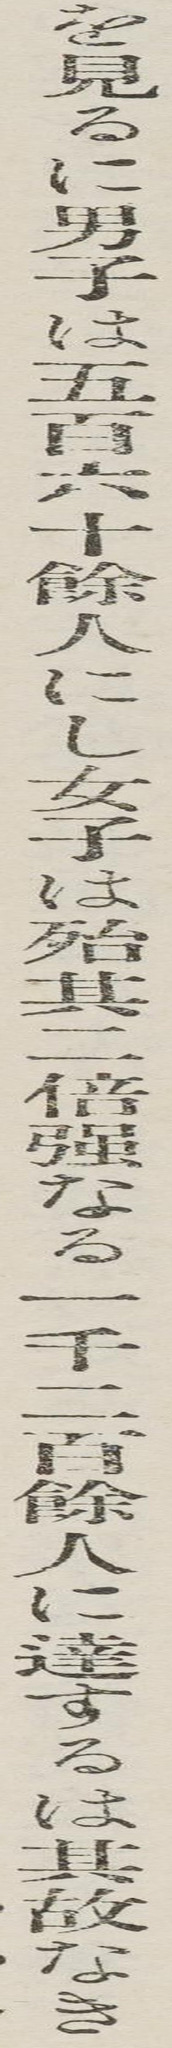を見るに男子は五百六十余人にし女子は殆其二倍強なる一千二百余人に達するは其故なき
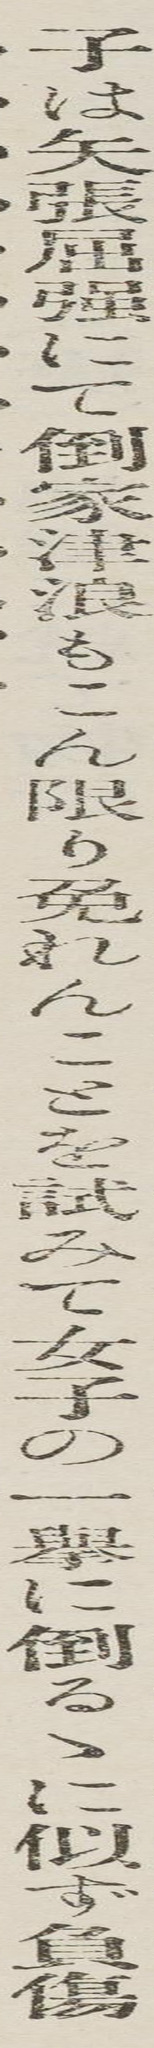子は矢張屈強にて倒家津浪もこん限り免れんことを試みて女子の一挙に倒るゝに似ず負傷
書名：土佐古今ノ地震
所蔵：東京大学地震研究所図書室 Earthquake Research Institute Library, The University of Tokyo, JAPAN
